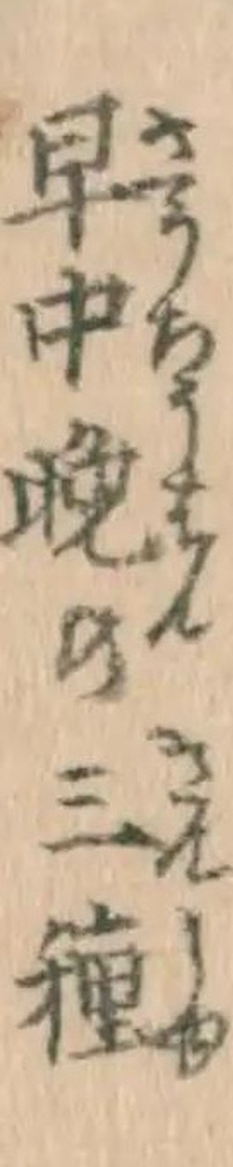早中晩の三種
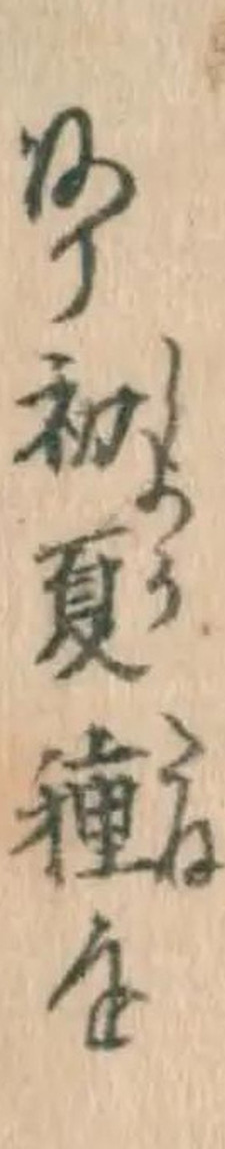あり初夏種を
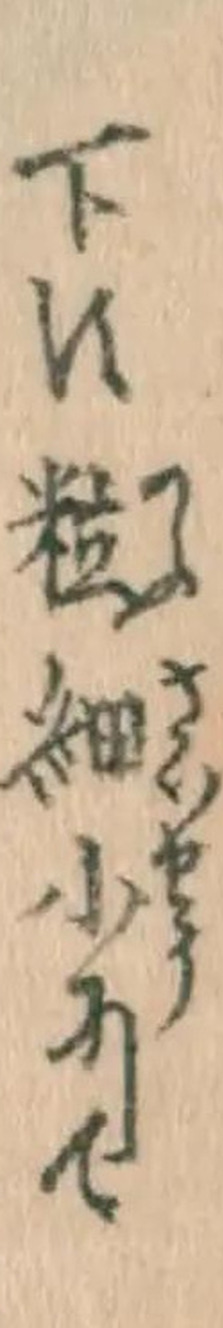下す粒細小にして
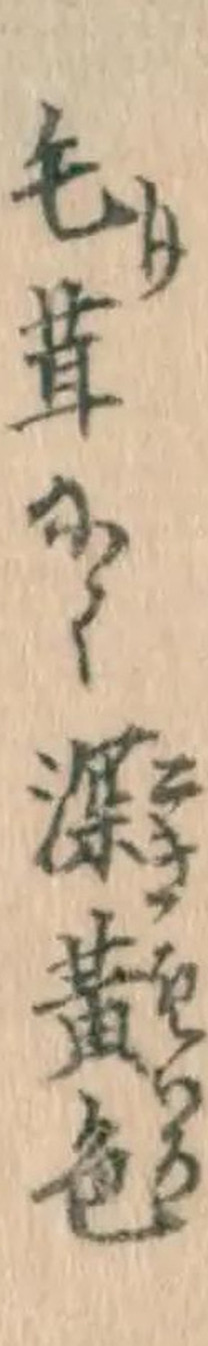毛茸なく深黄色
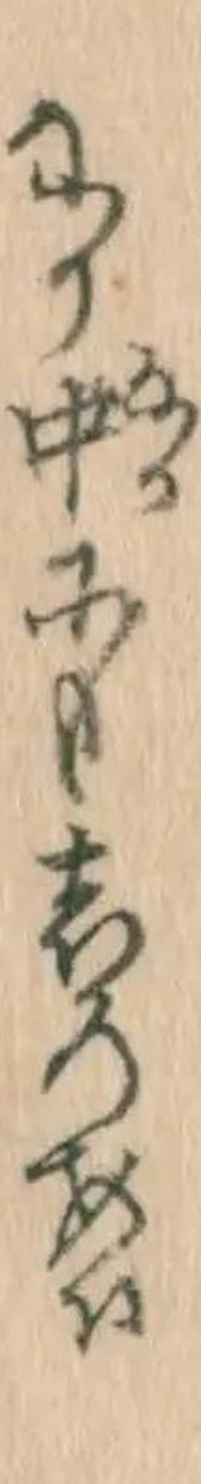なり中にもしろあは
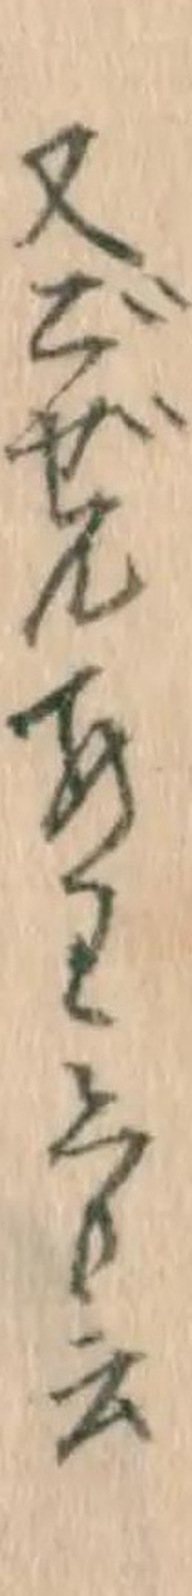又ごぜんあわとも云
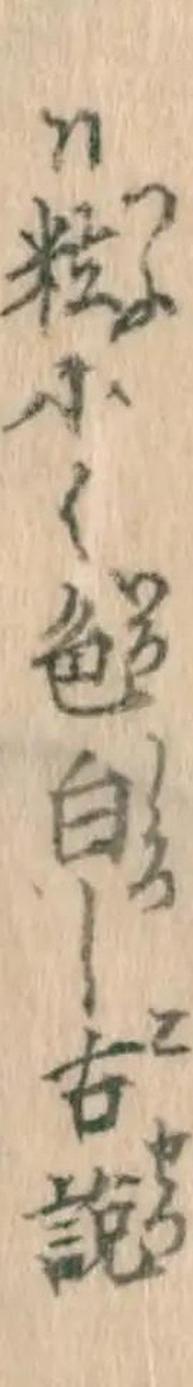は粒小く色白し古説
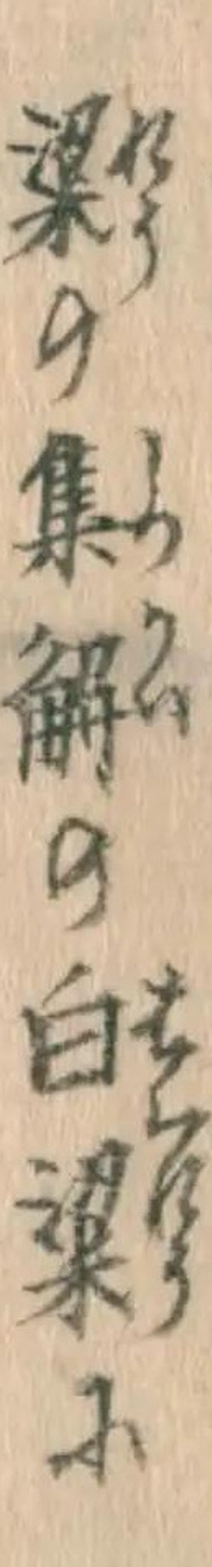粱の集解の白粱に
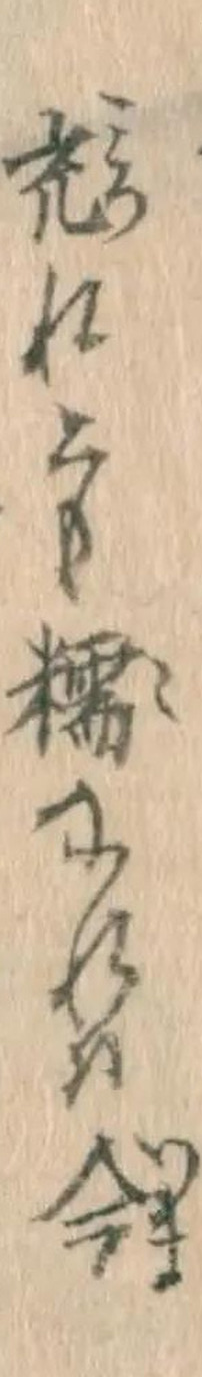充れとも糯なれは今
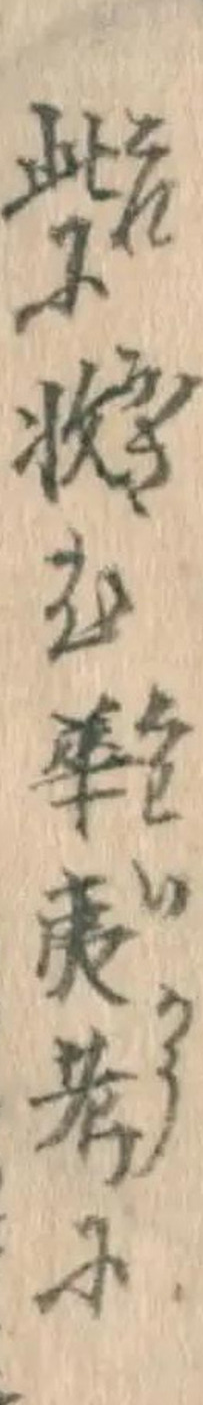此に収む華夷考に

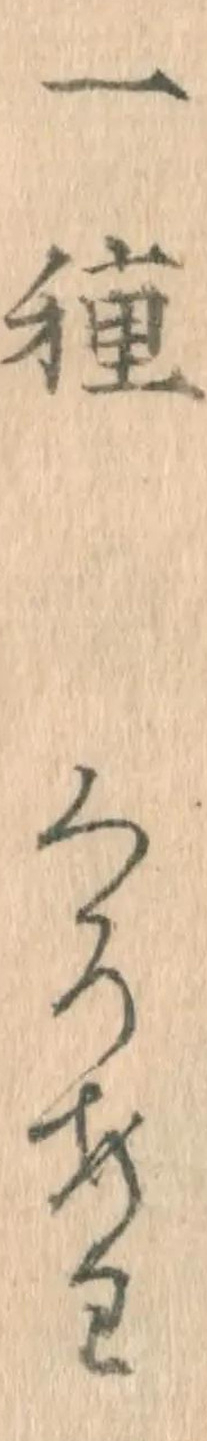一種くろあわ
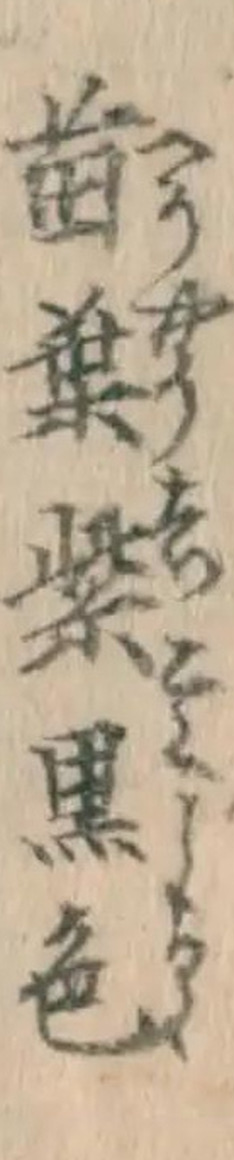苗葉紫黒色
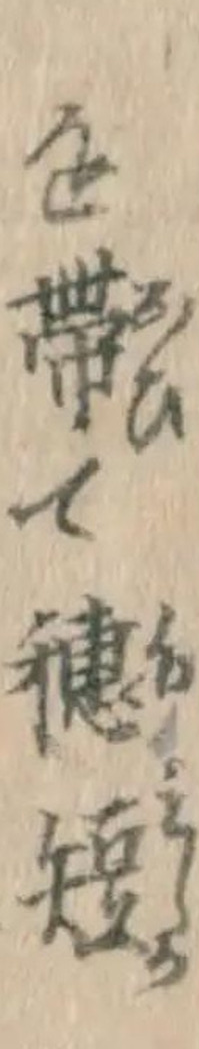を帯て穂短
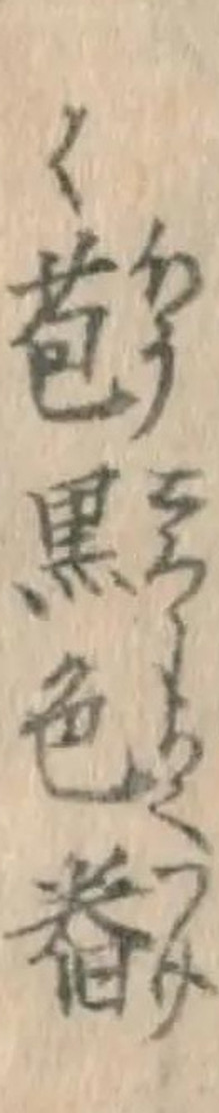く苞黒色舂
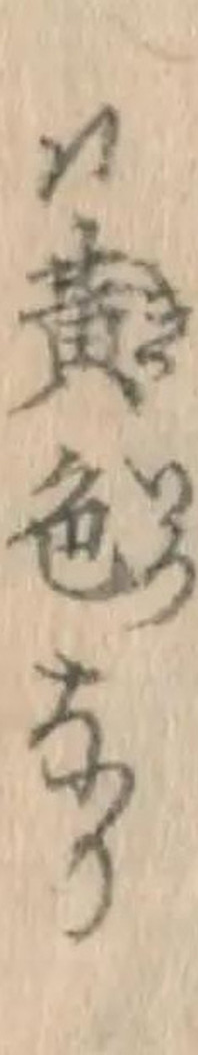は黄色なり

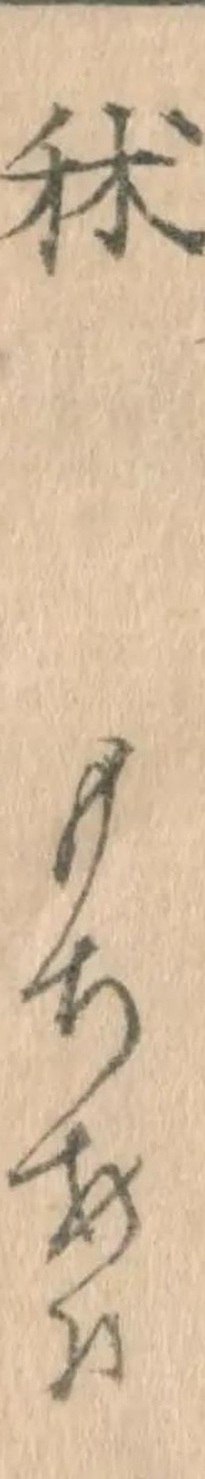秫もちあわ
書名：本草図譜. 巻40-42
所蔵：国立国会図書館 National Diet Library, JAPAN
